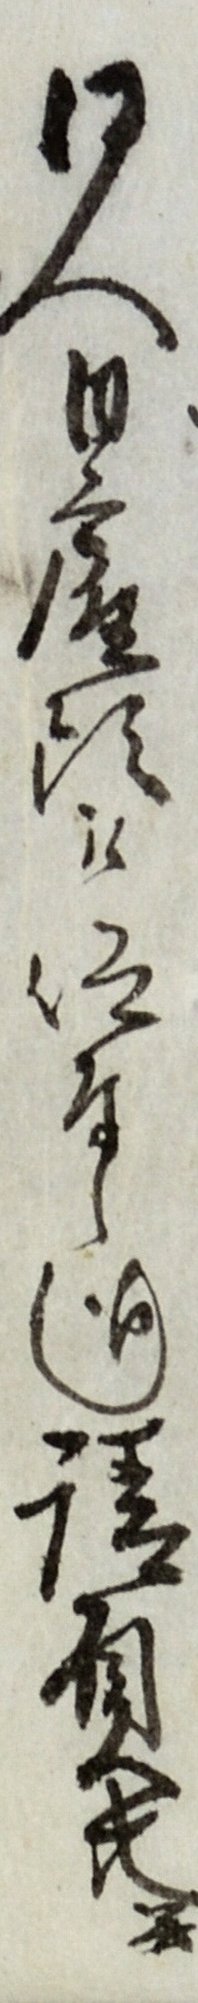同人日雇頭被仰付候趣請負共并
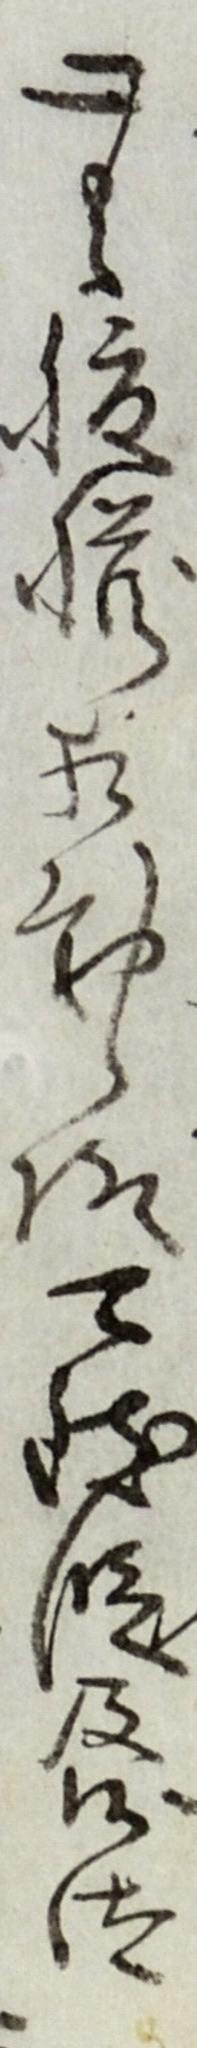無腹臓相勤候様可致段及沙汰
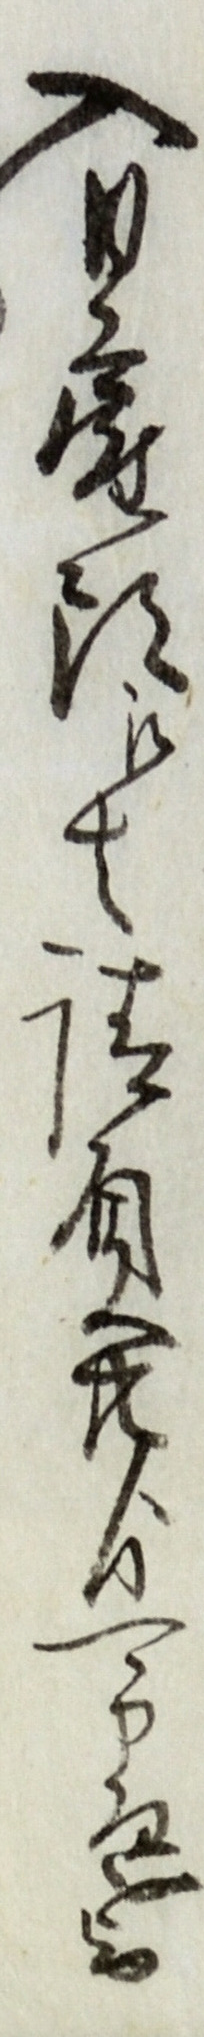入日雇頭江者請負共ゟ可申通旨
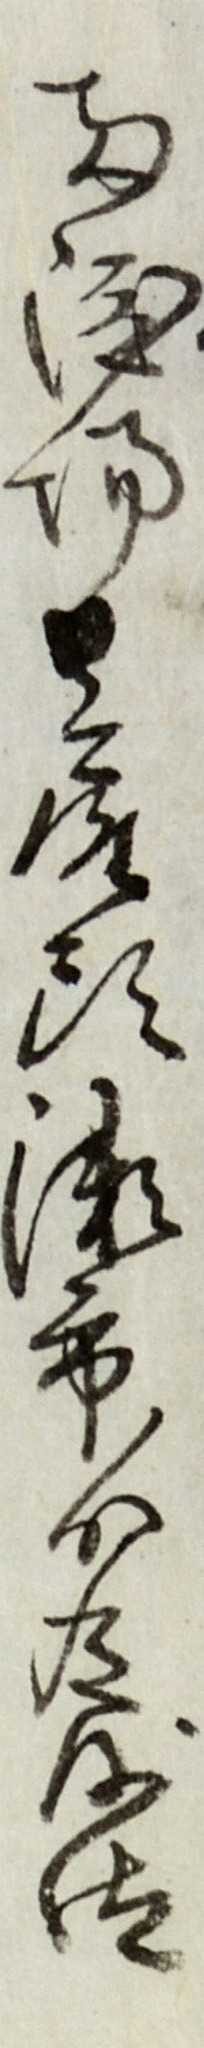両渡場日雇頭瀬市ゟ及沙汰
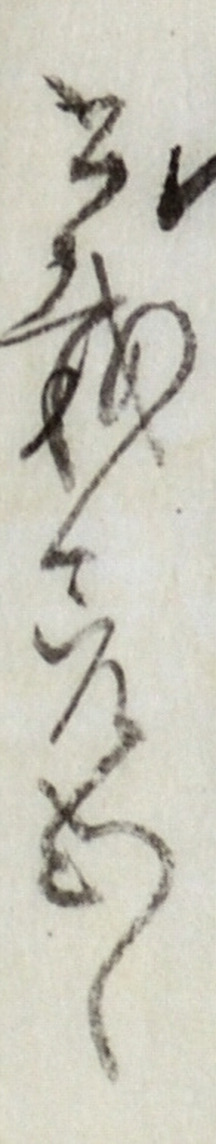書載差出候

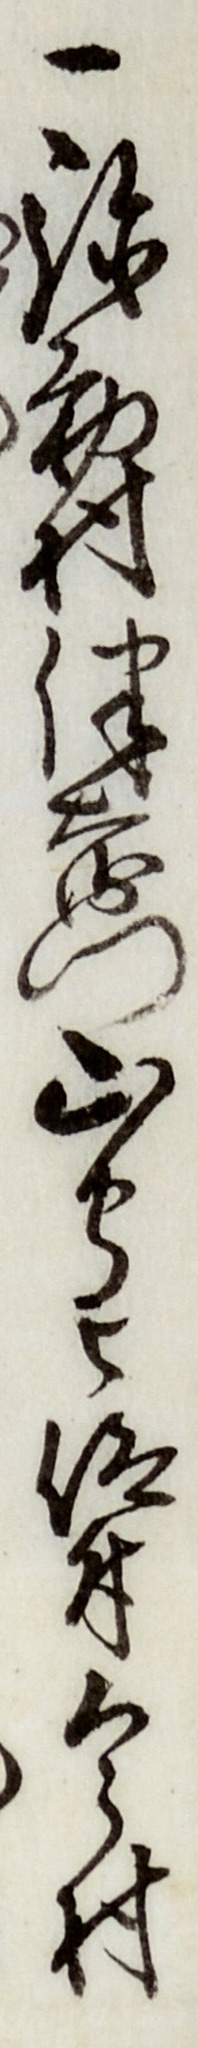一弥勒村伴右衛門山守被仰付今村
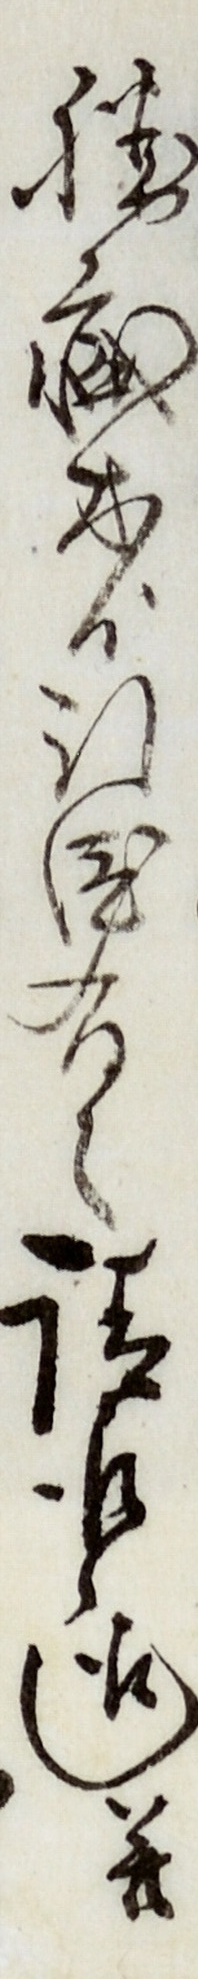勝蔵方ゟ引渡有之請取候趣并
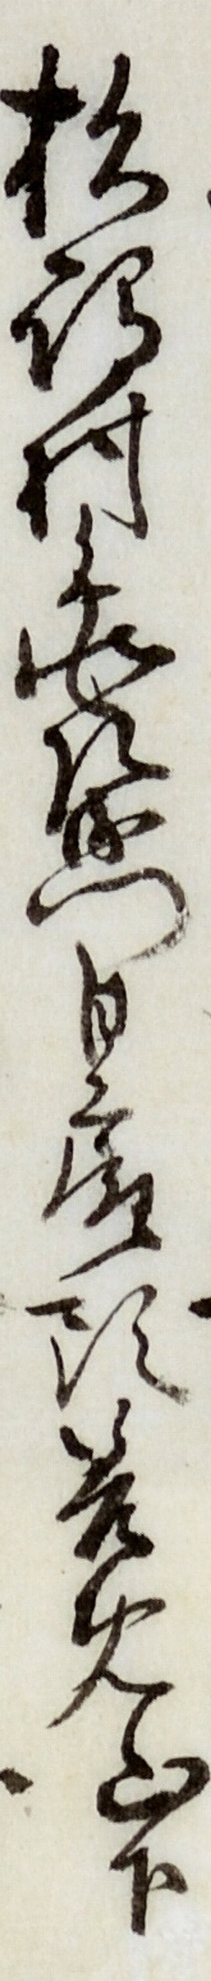杉嶋村亀左衛門日雇頭差免山下
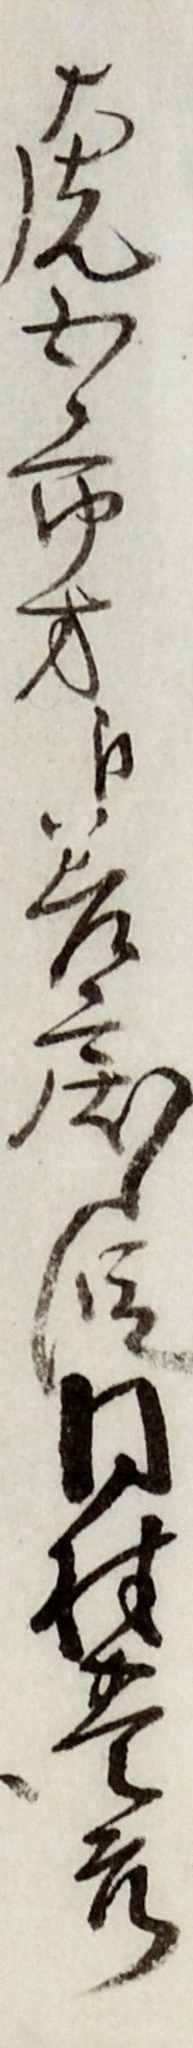虎五郎方江差戻候段同村豊蔵
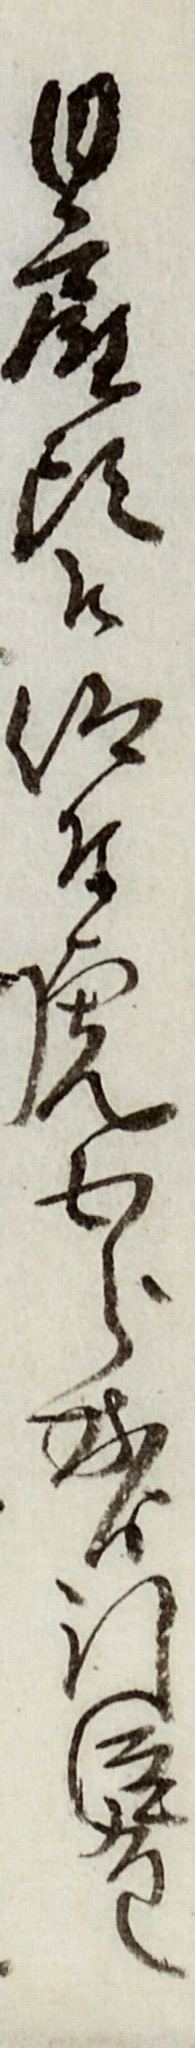日雇頭被仰付虎五郎方ゟ引渡有之
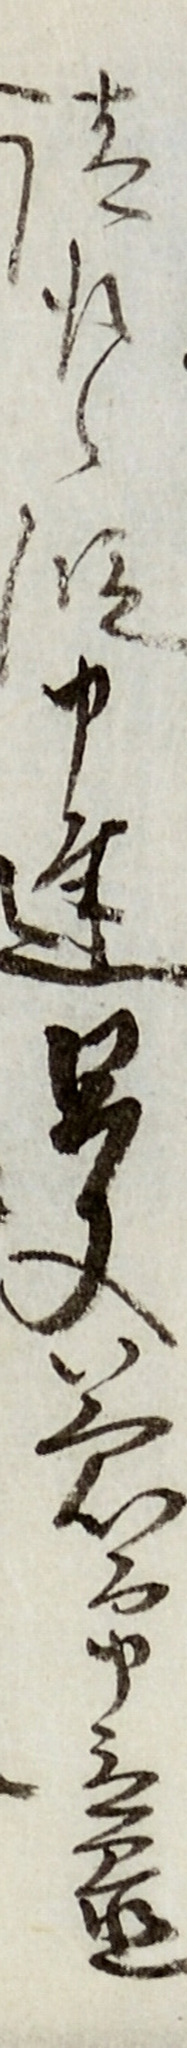請取候段申達且又兼而申立置
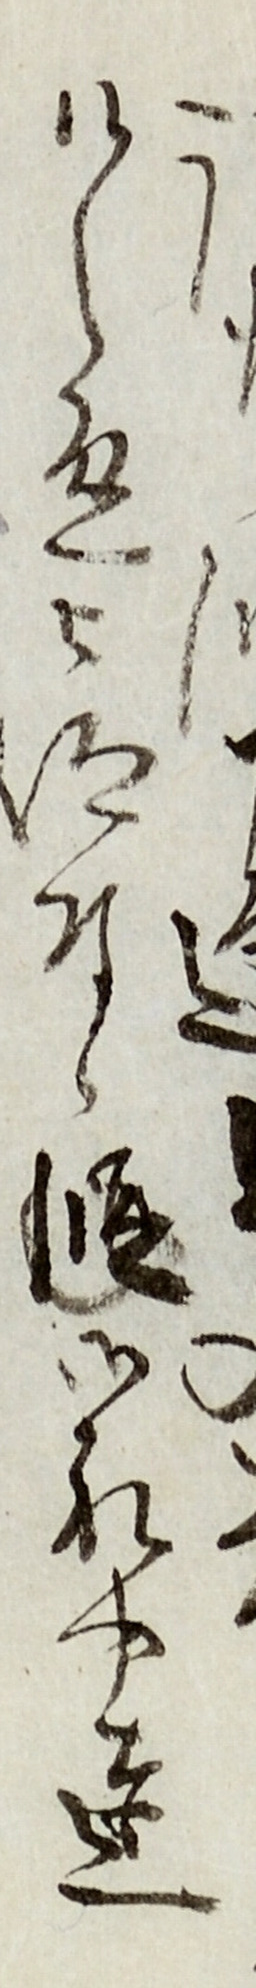候之通被仰付候段御礼申達
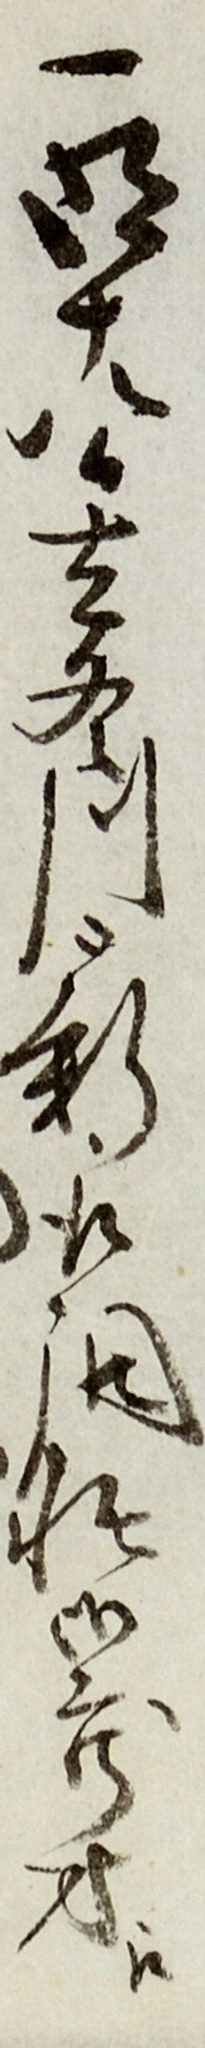一明十八日去冬川薪取調帳御蔵方江
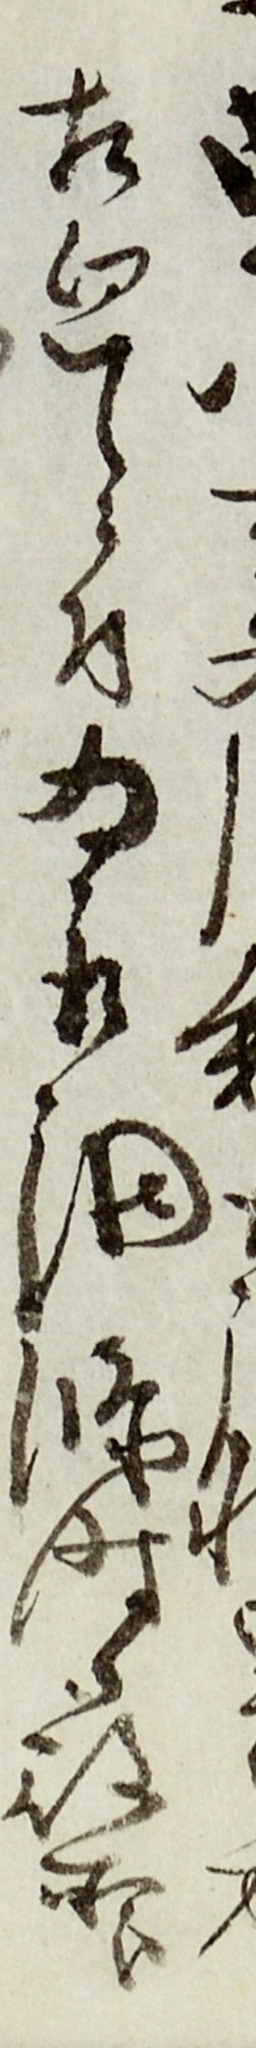相廻候ニ付為取調臨時御役所江
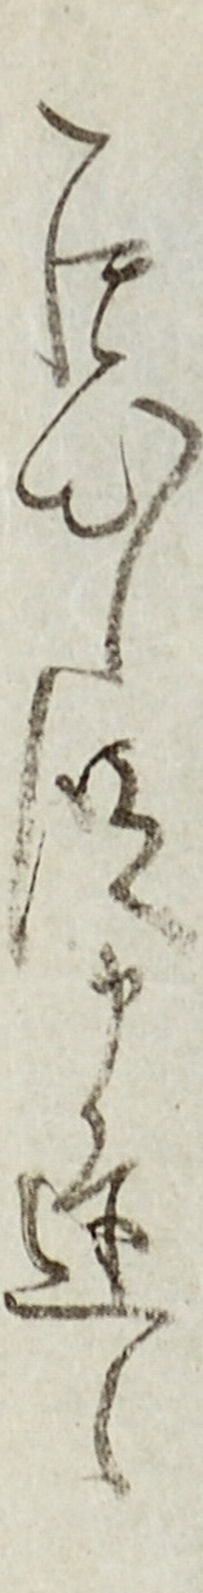罷出候段申達候
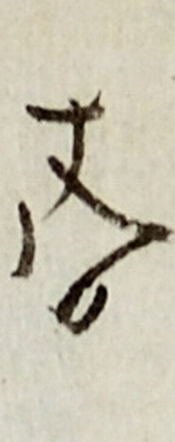十八日
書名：御山方御薪方諸事御用留
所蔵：伊那市立高遠町図書館・合同会社AMANE
